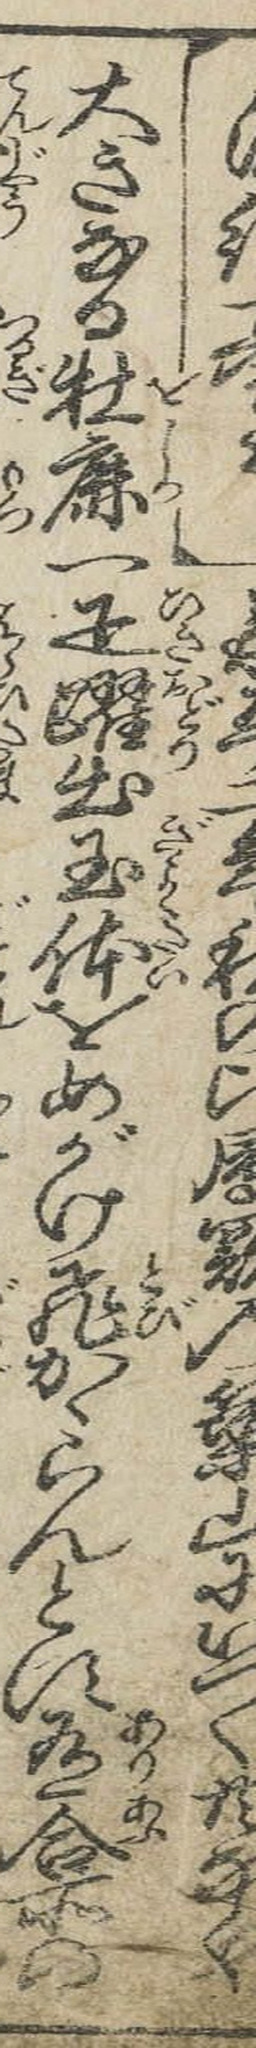大きなる牡鹿一疋躍出玉体をめがけ飛かゝらんとす有合所の
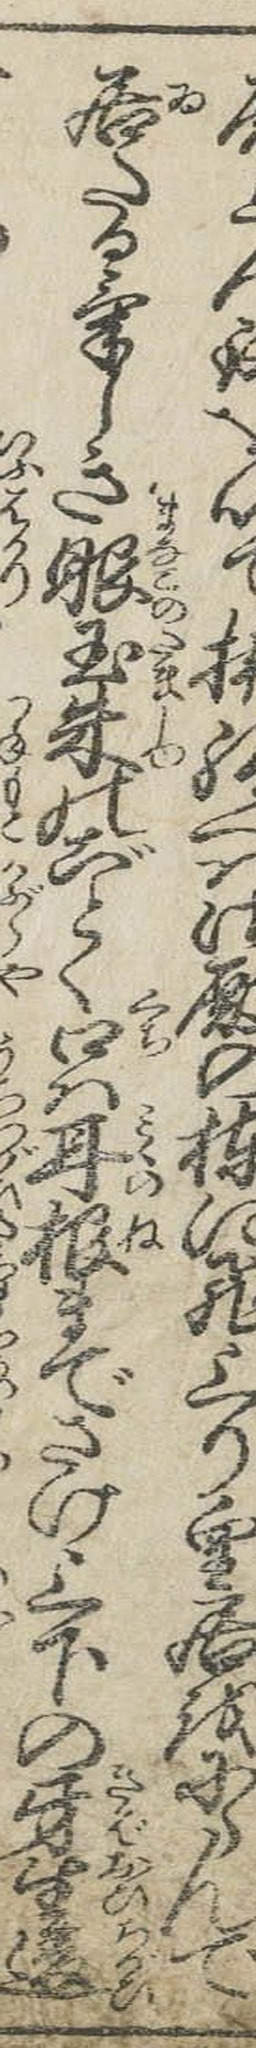居たるけしき眼玉朱のごとく口は耳根までさけ上下の牙生違
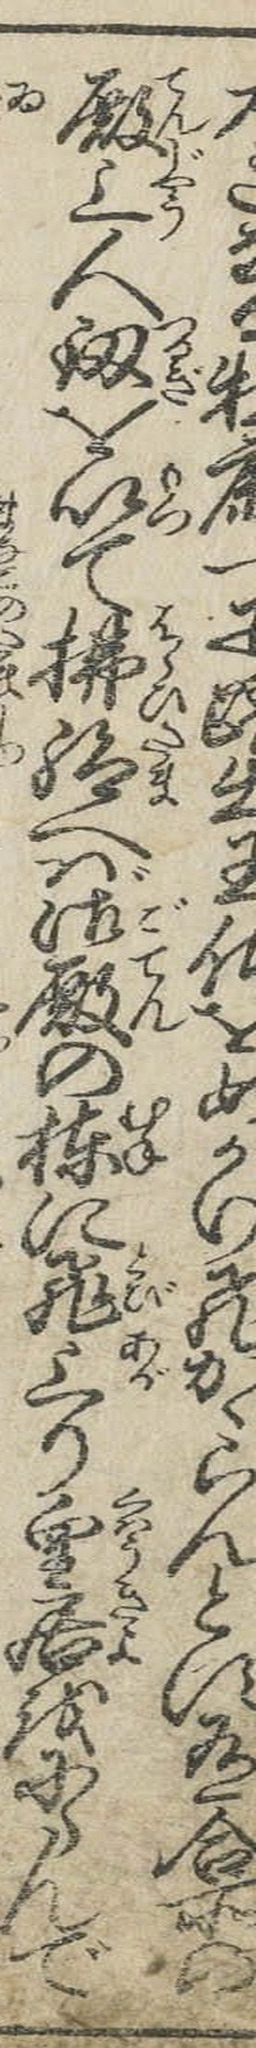殿上人剣を以て払給へば御殿の棟に飛上り皇居をにらんで
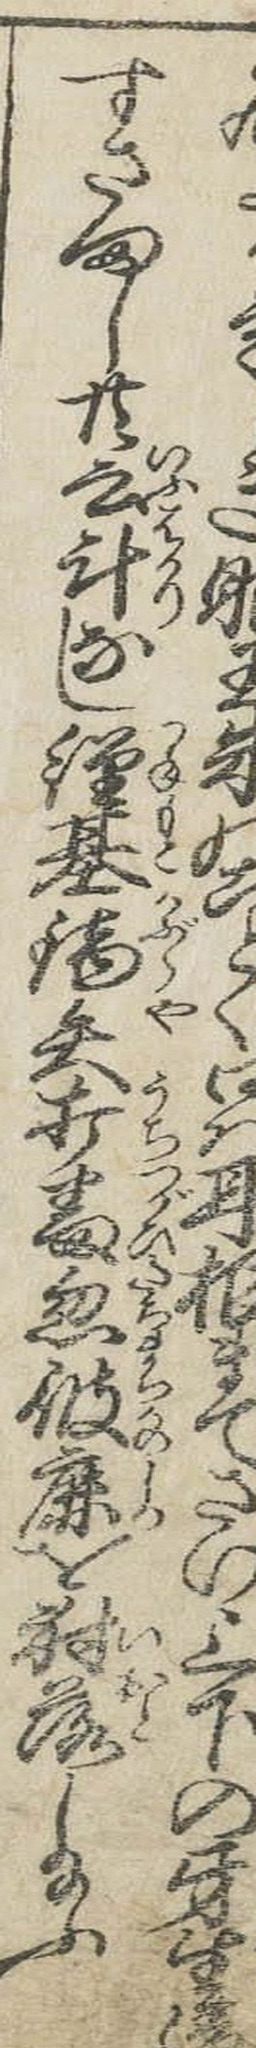すさまし共云計なし経基鏑矢打番忽彼鹿を射落し給ふ
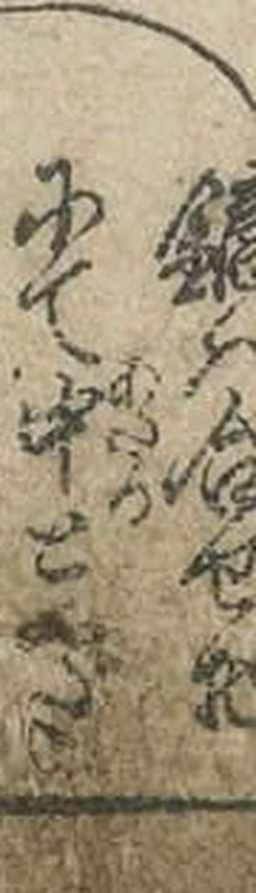にて中とくだ
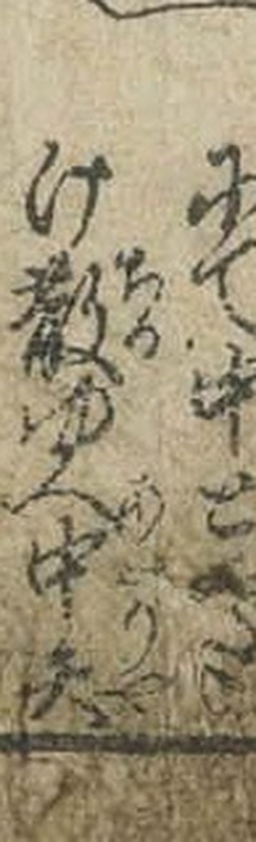け散ゆへ中矢
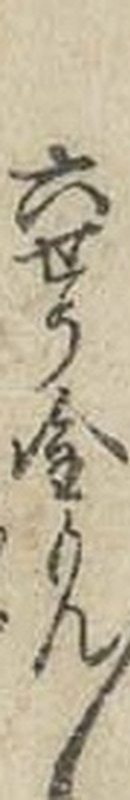六せう金もん
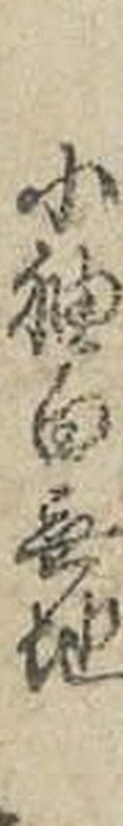小袖白無地
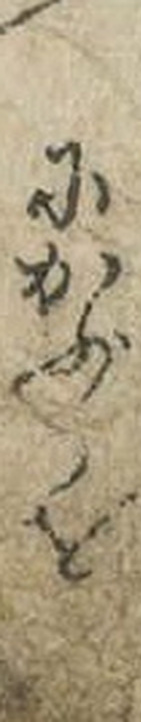にかぶらを

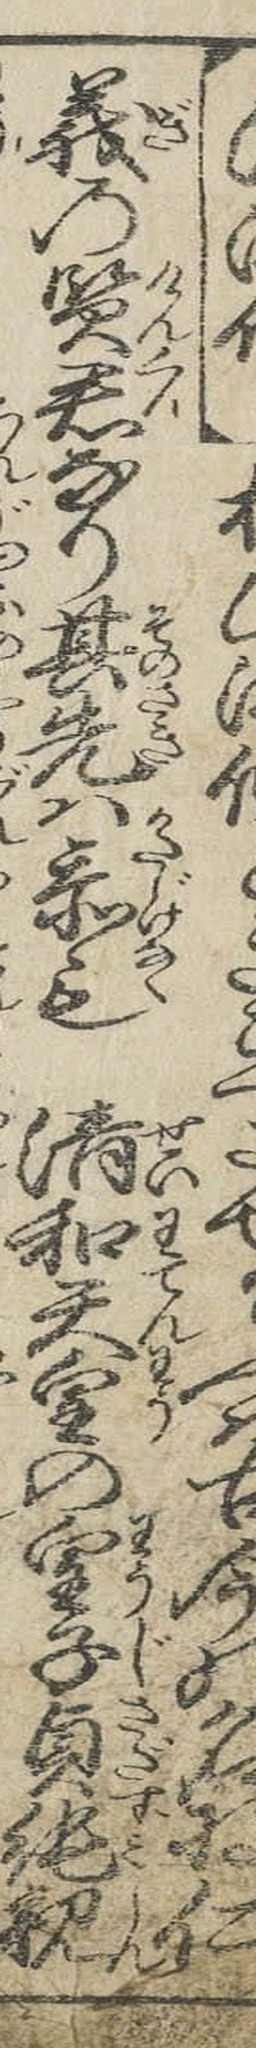義の賢君なり其先は忝も清和天皇の皇子貞純親
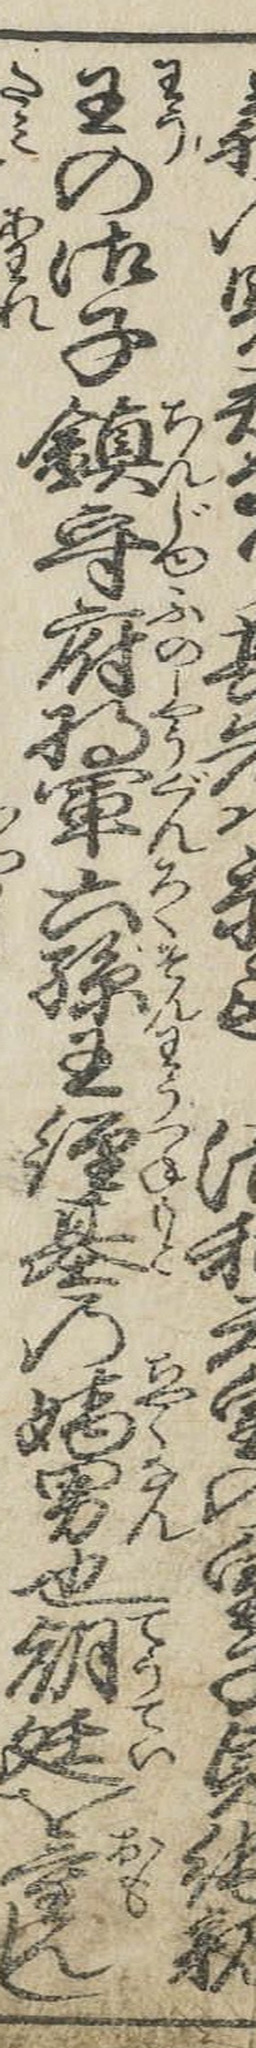王の御子鎮守府将軍六孫王経基の嫡男也朝廷を重んし
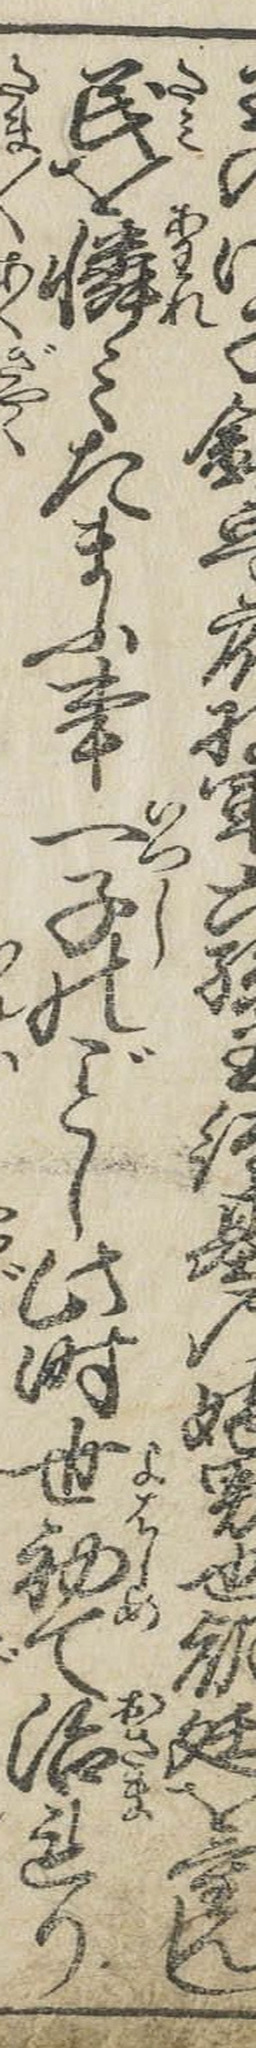民を憐みたまふ事一子のごとし此時世初て治れり
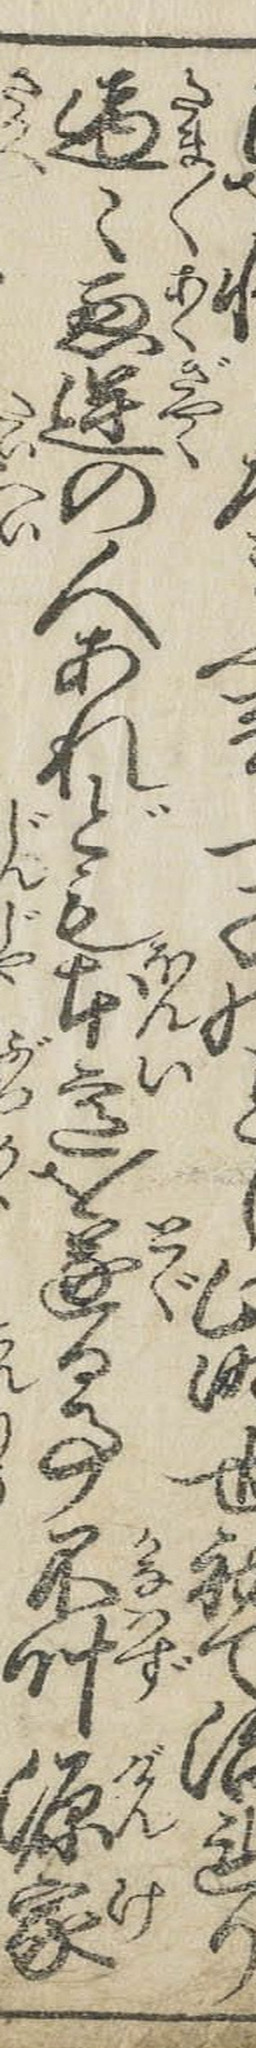適々悪逆の人あれども本意を遂る事不叶源家
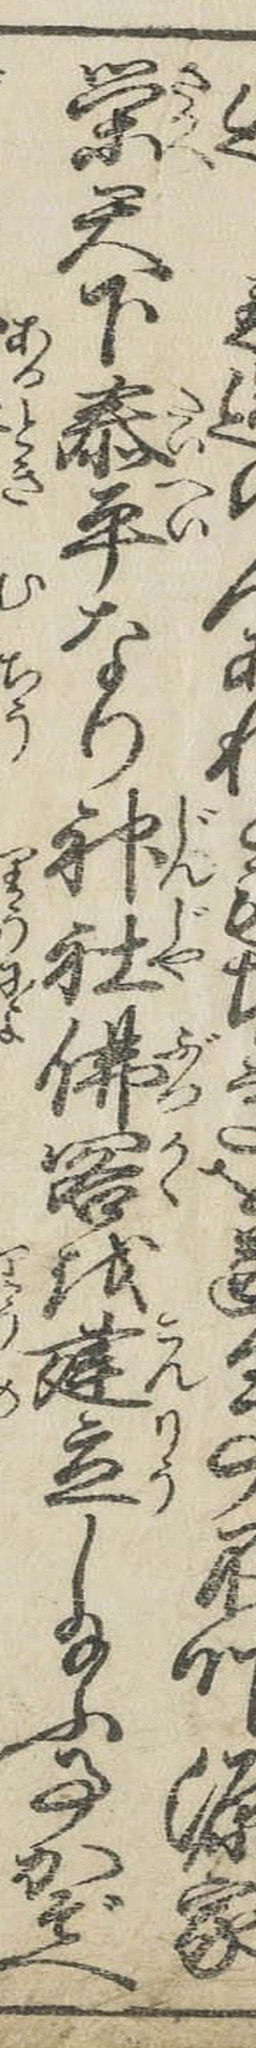栄天下泰平なり神社仏閣を建立し給ふ事かぞへ
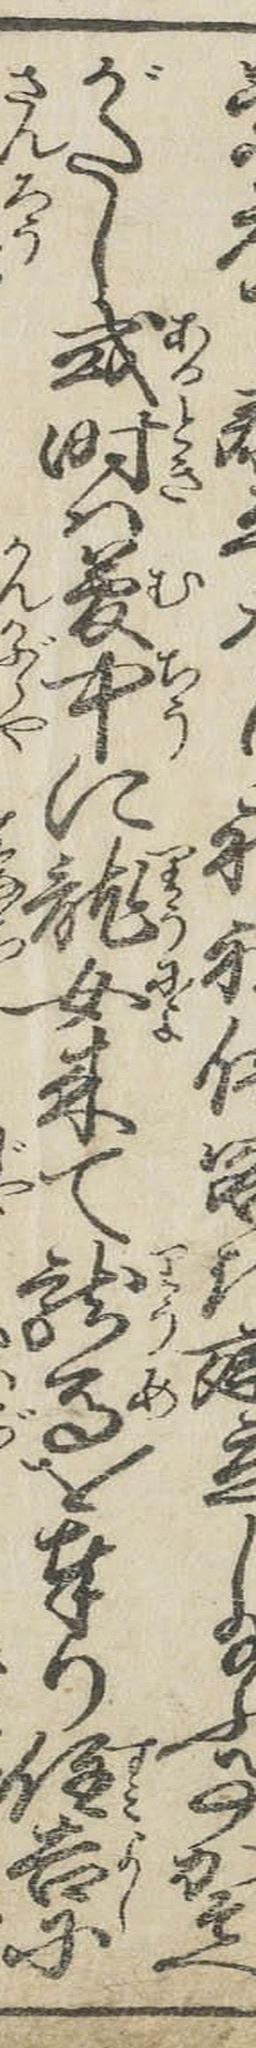がたし或時は夢中に龍女来て龍馬を奉り住吉に
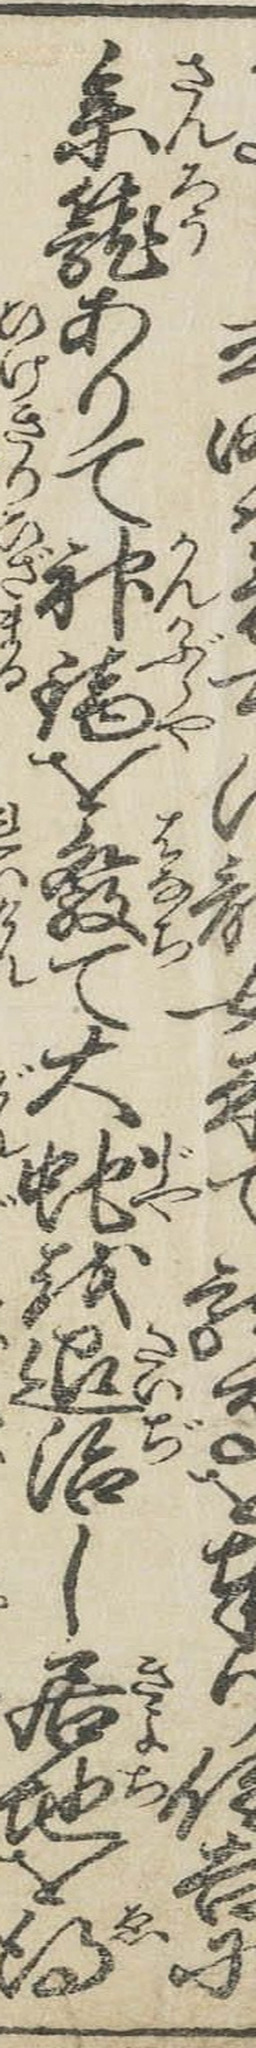参籠ありて神鏑を発て大蛇を退治し居地を得
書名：絵本写宝袋 9巻 2之巻
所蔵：東京学芸大学教育コンテンツアーカイブ
